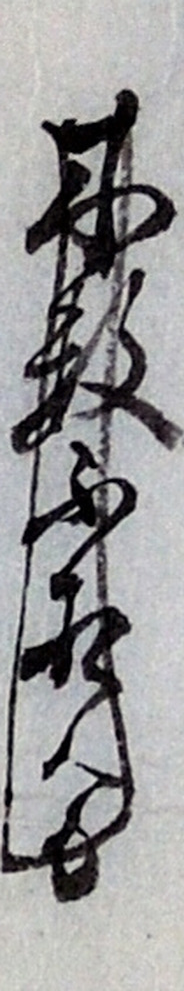木数不相分
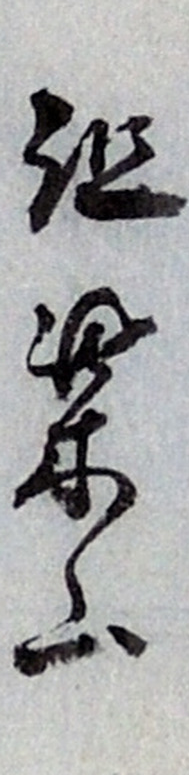但柴山
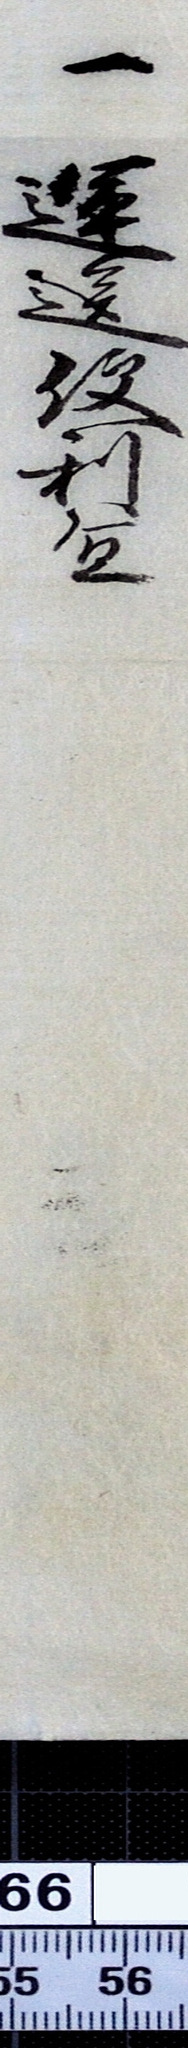一運送便利宜
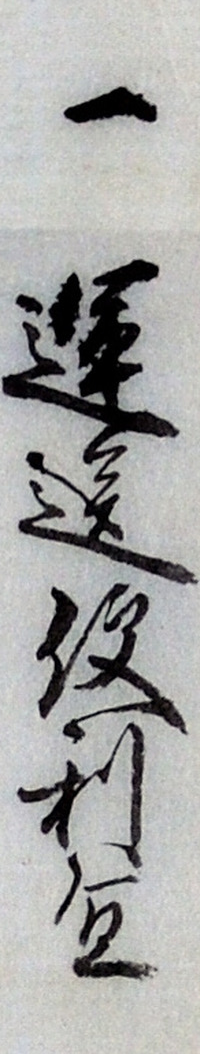一運送便利宜
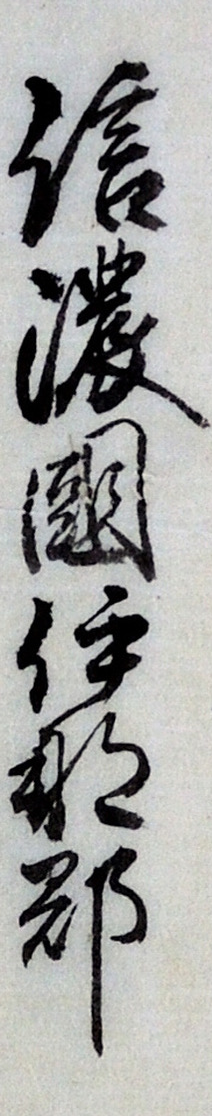信濃国伊那郡
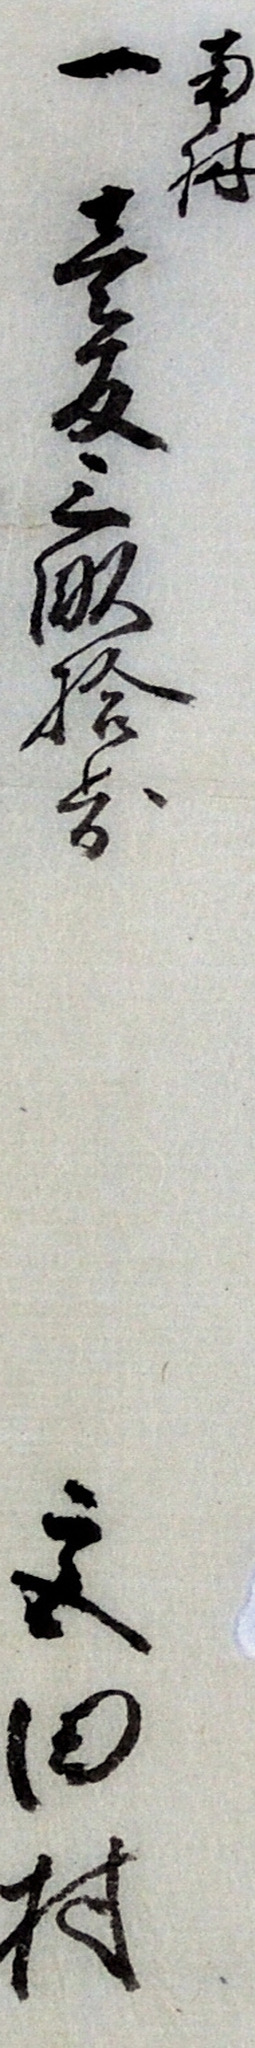一壱反三㽗拾歩宮田村
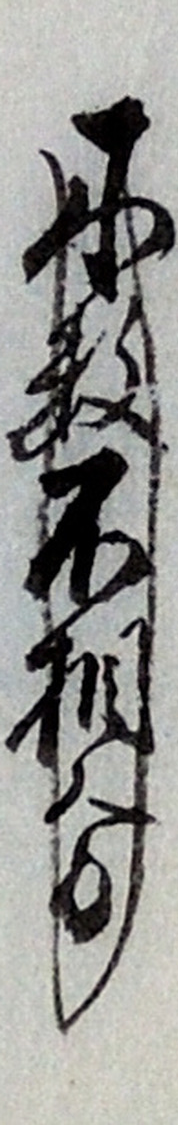木数不相分
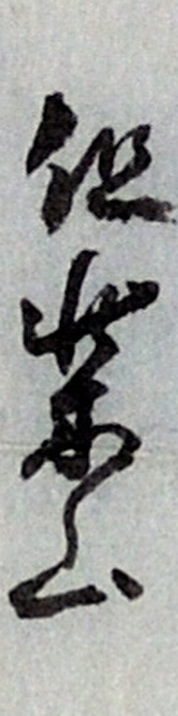但柴山
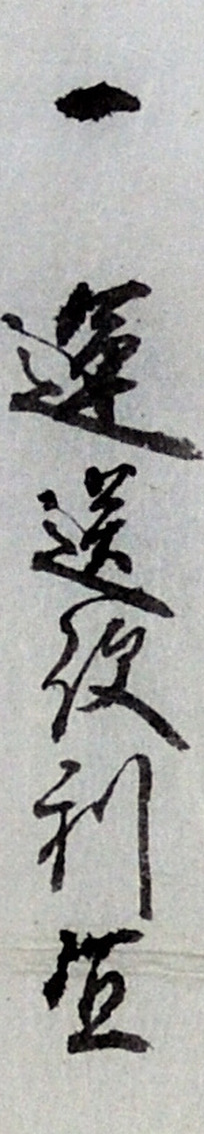一運送便利宜
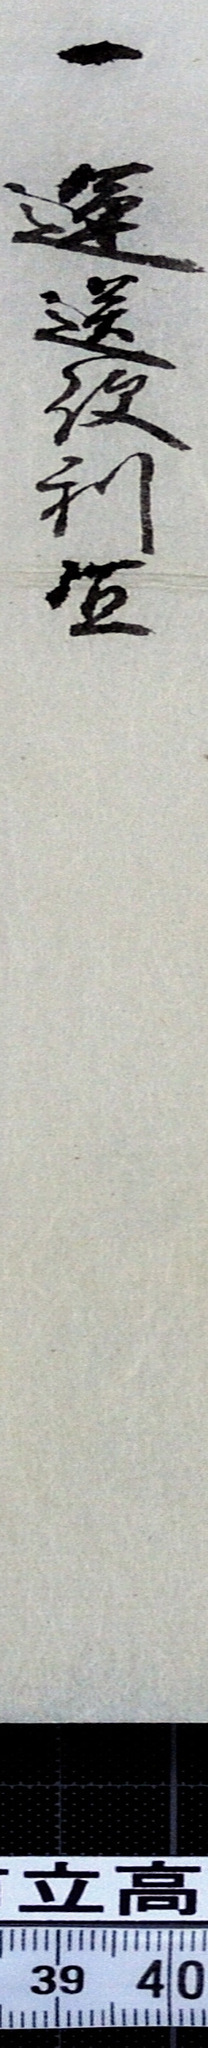一運送便利宜
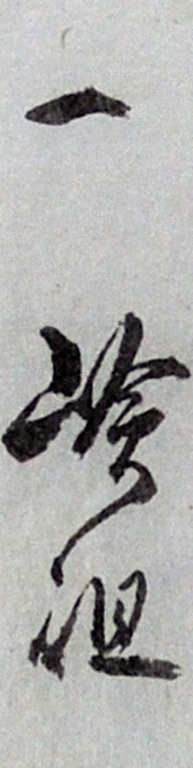一嶮岨

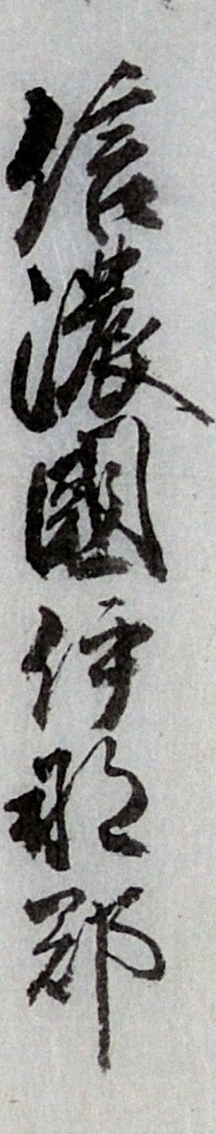信濃国伊那郡
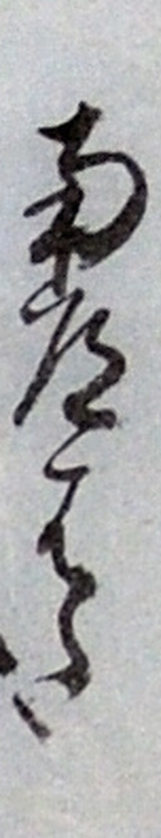南道はた
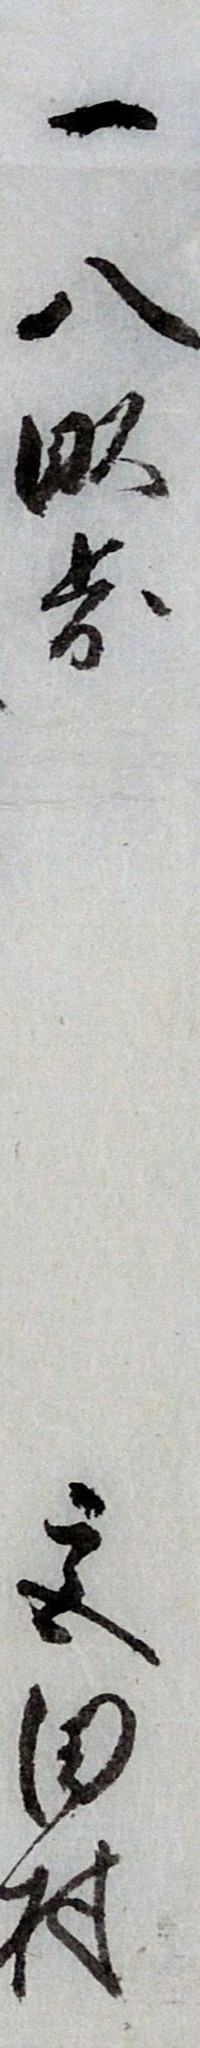一八㽗歩宮田村
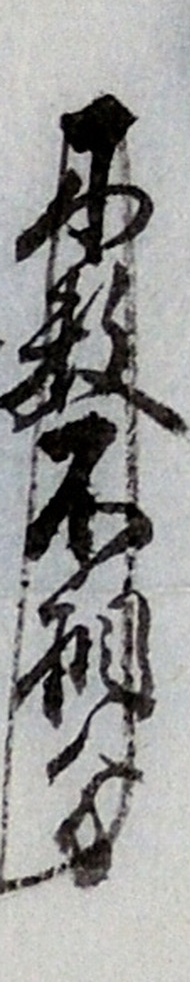木数不相分
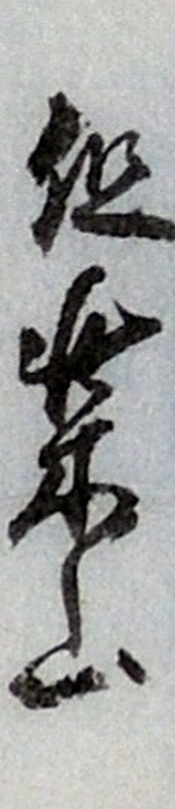但柴山
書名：官林反別帳
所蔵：伊那市立高遠町図書館・合同会社AMANE
